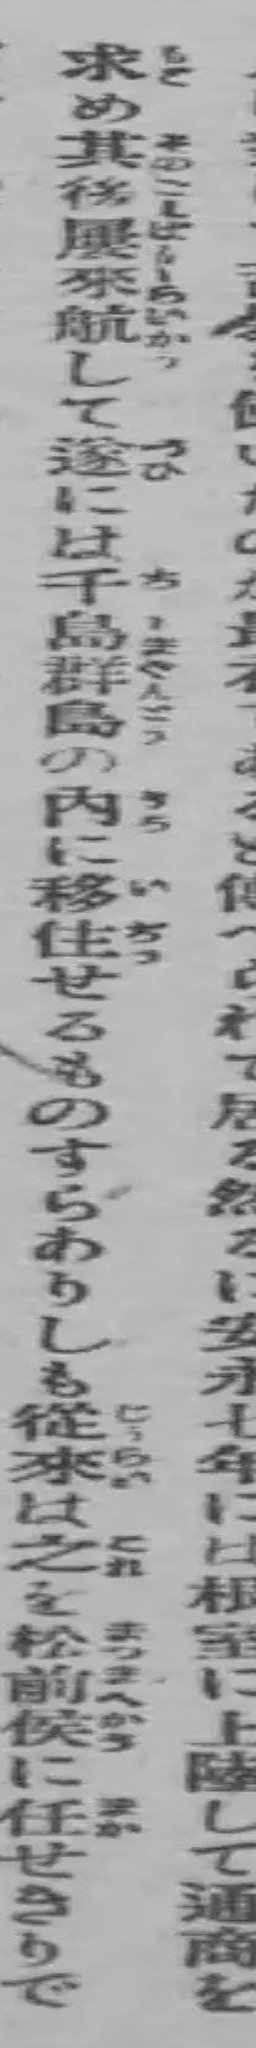求め其後屡来航して遂には千島群島の内に移住せるものすらありしも従来は之を松前侯に任せきりで
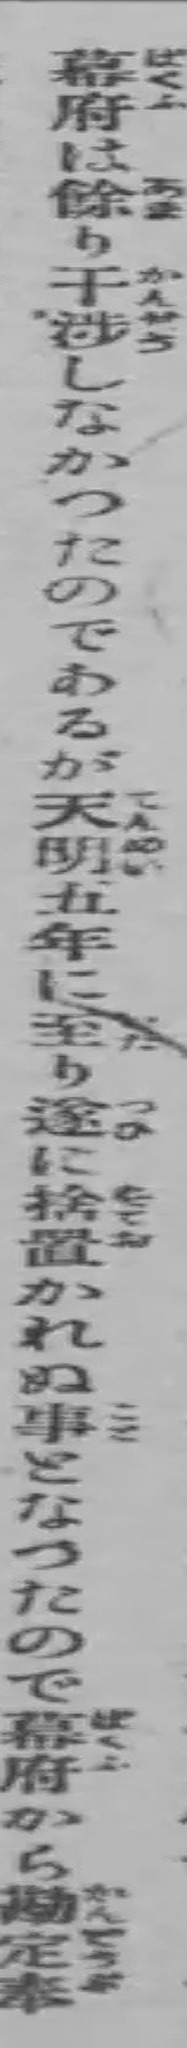幕府は余り干渉しなかつたのであるが天明五年に至り遂に捨置かれぬ事となつたので幕府から勘定奉
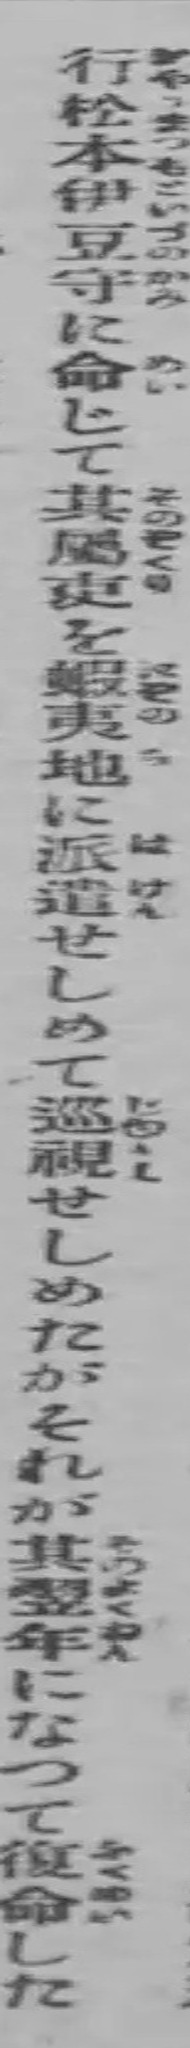松本伊豆守行松本伊豆守に命じて其属吏を蝦夷地に派遣せしめて巡視せしめたがそれが其翌年になつて復命した
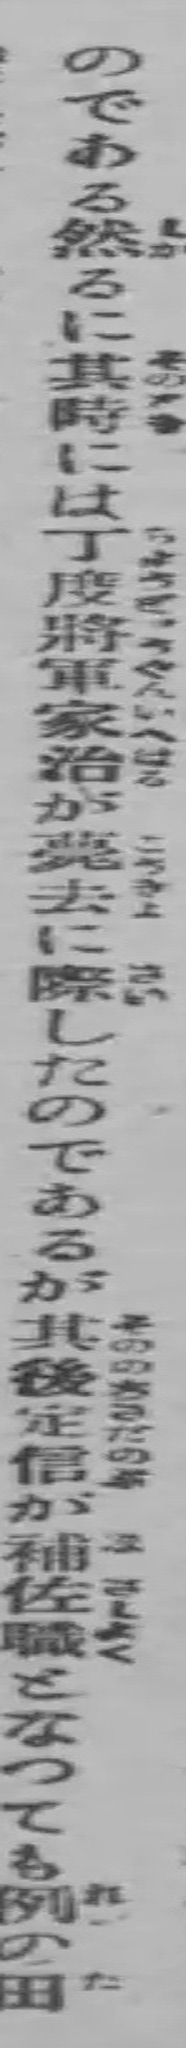のである然るに其時には丁度将軍家治が薨去に際したのであるが其後定信が補佐職となつても例の田
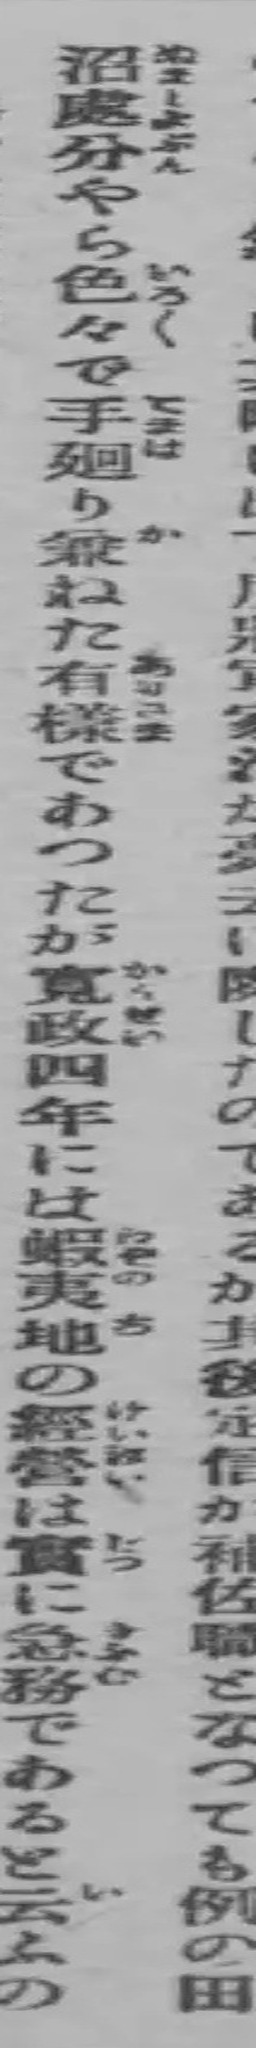最上徳内沼処分やら色々で手廻り兼ねた有様であつたが寛政四年には蝦夷地の経営は実に急務であると云ふの
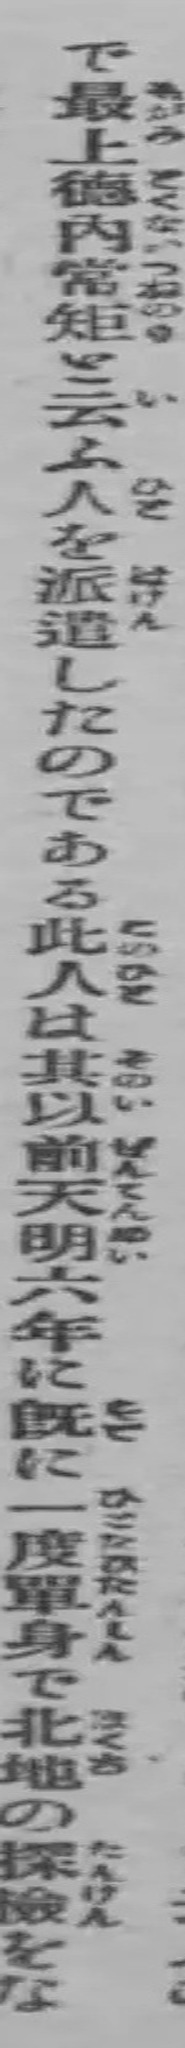で最上徳内常矩と云ふ人を派遣したのである此人は其以前天明六年に既に一度単身で北地の探検をな
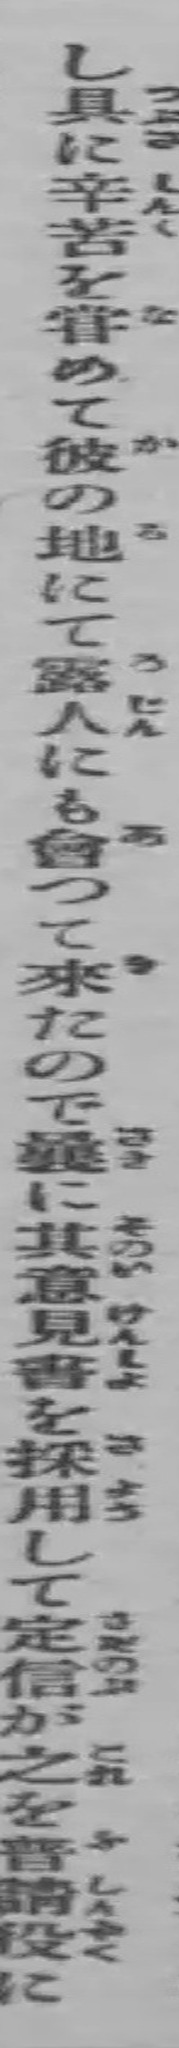し具に辛苦を甞めて彼の地にて露人にも会つて来たので曩に其意見書を採用して定信が之を普請役に
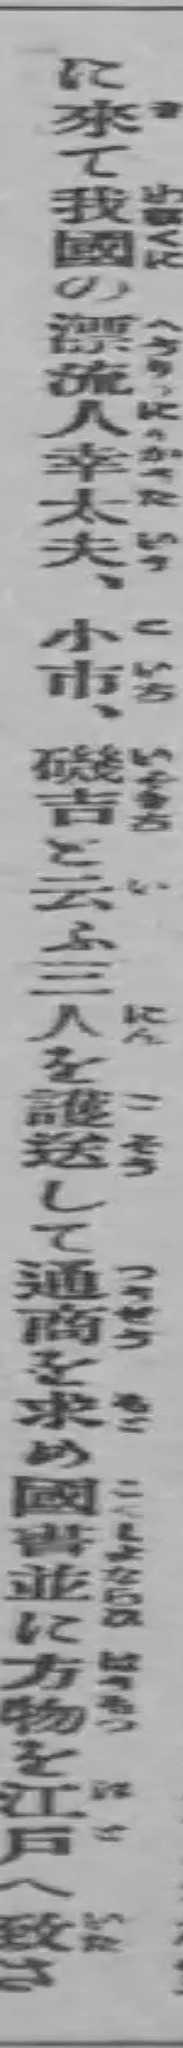に来て我国の漂流人幸太夫、小市、磯吉と云ふ三人を護送して通商を求め国書並に方物を江戸へ致さ
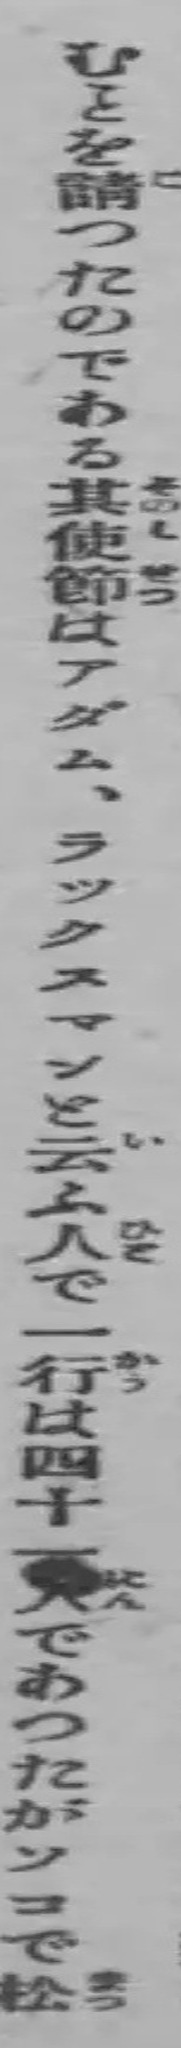むことを請つたのである其使節はアダム、ラツクスマンと云ふ人で一行は四十一人であつたがソコで松
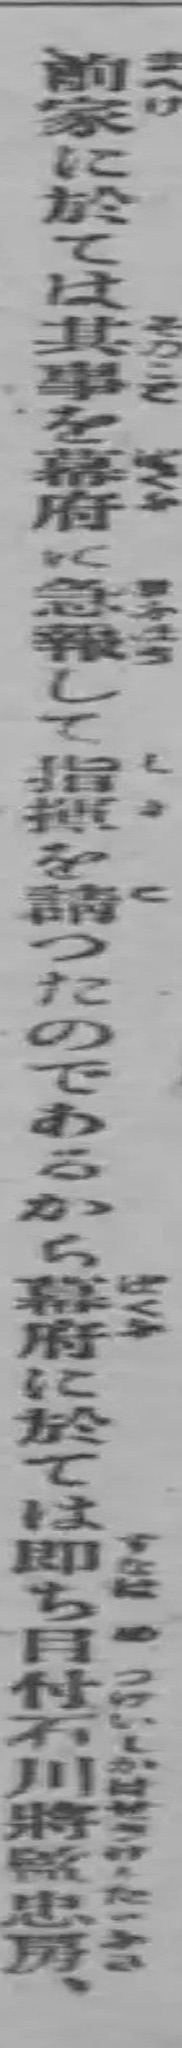前家に於ては其事を幕府に急報して指揮を請つたのであるから幕府に於ては即ち目付石川将監忠房、
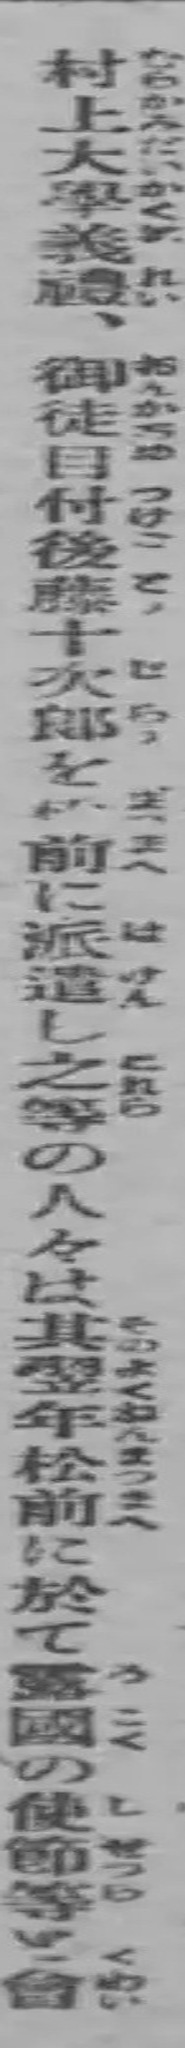村上大学義礼、御徒目付後藤十次郎を松前に派遣し之等の人々は其翌年松前に於て露国の使節等と会
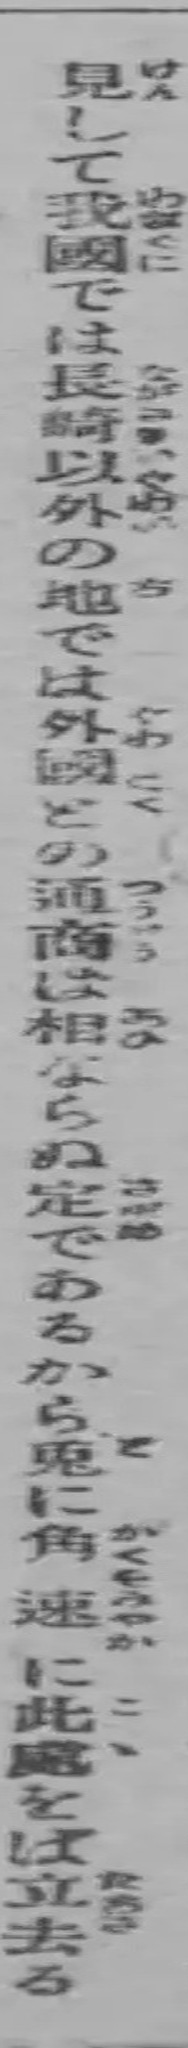見して我国では長崎以外の地では外国との通商は相ならぬ定であるから兎に角速に此処をば立去る
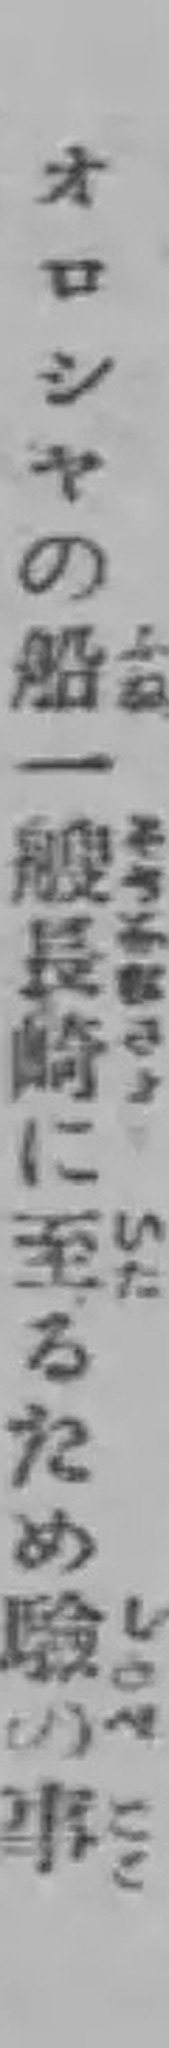オロシヤの船一艘長崎に至るため験の事
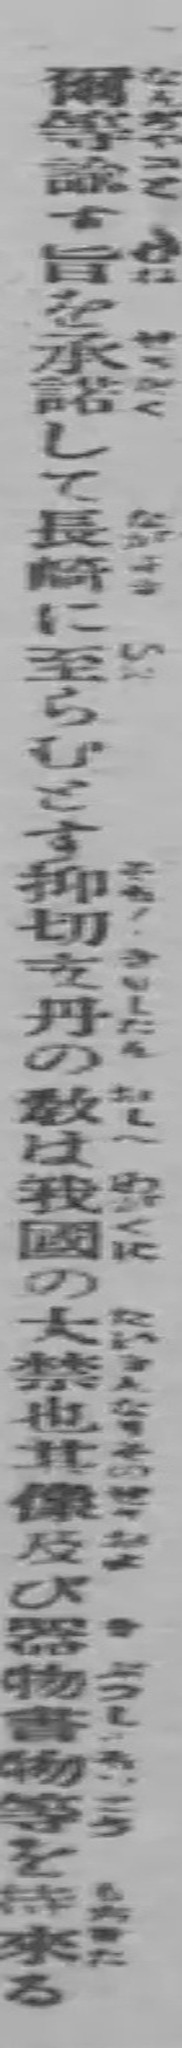爾等諭す旨を承諾して長崎に至らむとす抑切支丹の教は我国の大禁也其像及び器物書物等を持来る
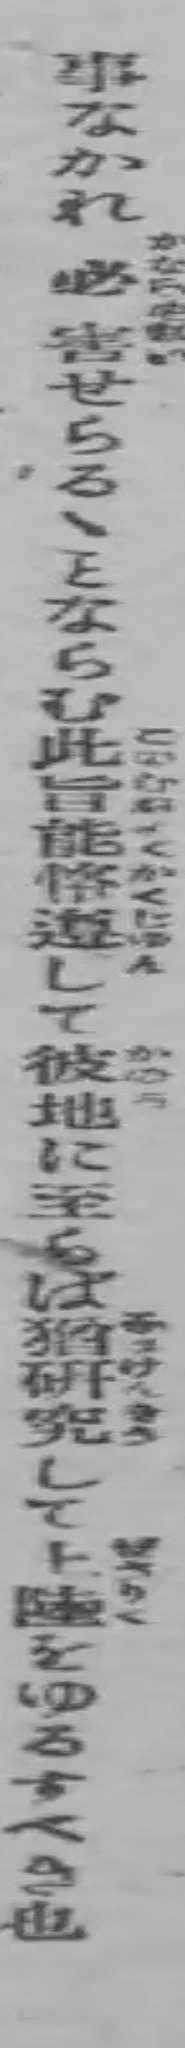事なかれ必害せらるゝことならむ此旨能格遵して彼地に至らば猶研究して上陸をゆるすべき也
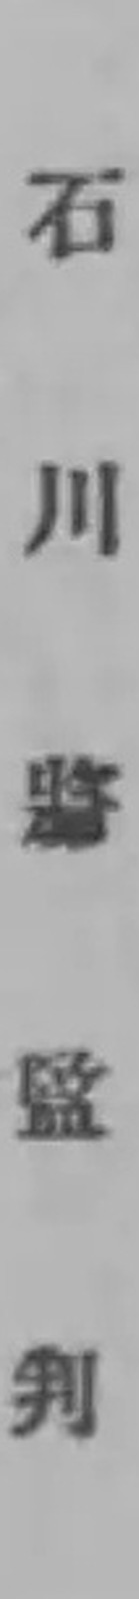石川将監判
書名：豊橋市史談
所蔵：国立国会図書館 National Diet Library, JAPAN
